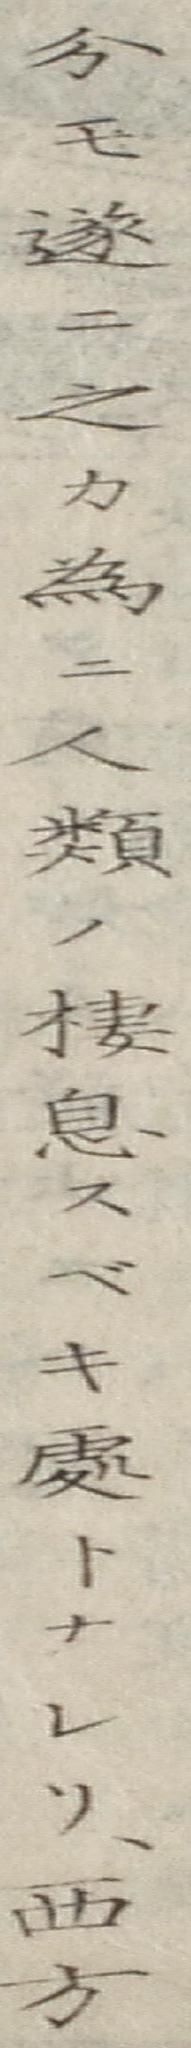分モ遂ニ之カ為ニ人類ノ棲息スベキ處トナレリ、西方
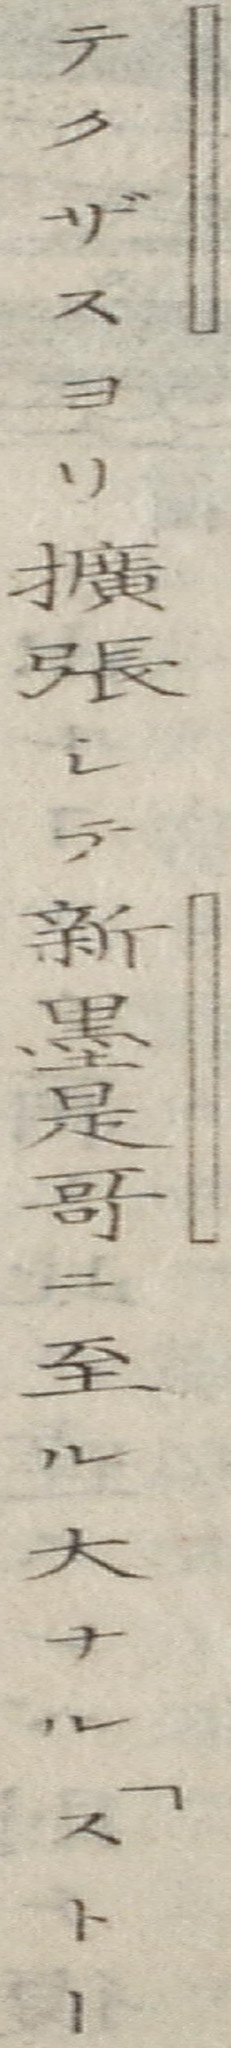テクザスヨリ拡張シテ新墨是哥ニ至ル大ナル「ストー
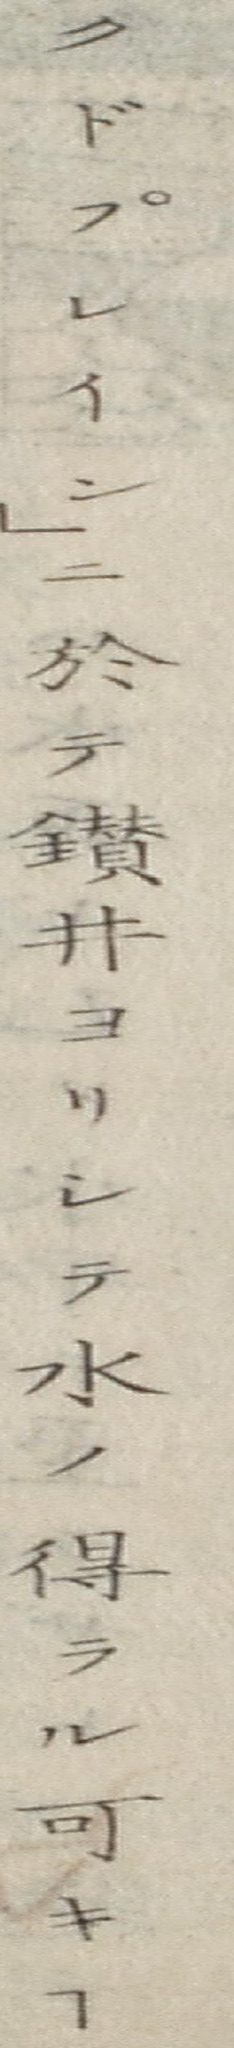クドプレイン」ニ於テ鑚井ヨリシテ水ノ得ラル可キヿ
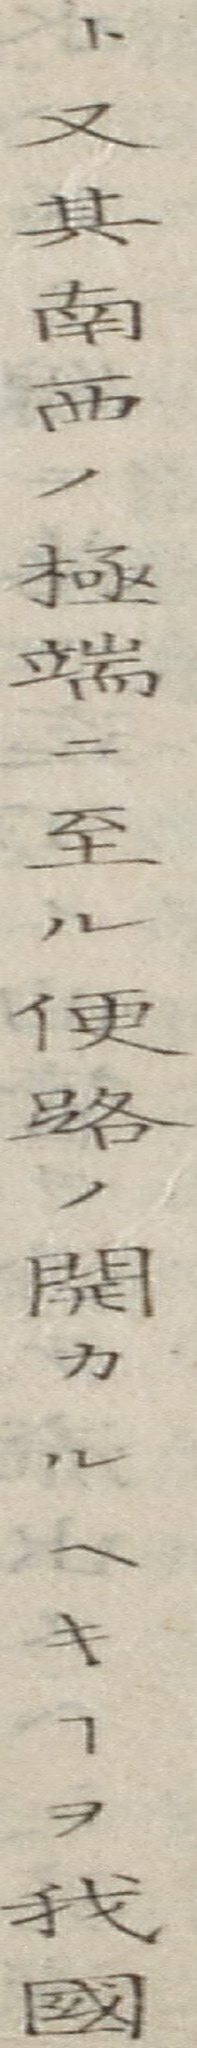ト又其南西ノ極端ニ至ル便路ノ開カルヘキヿヲ我国
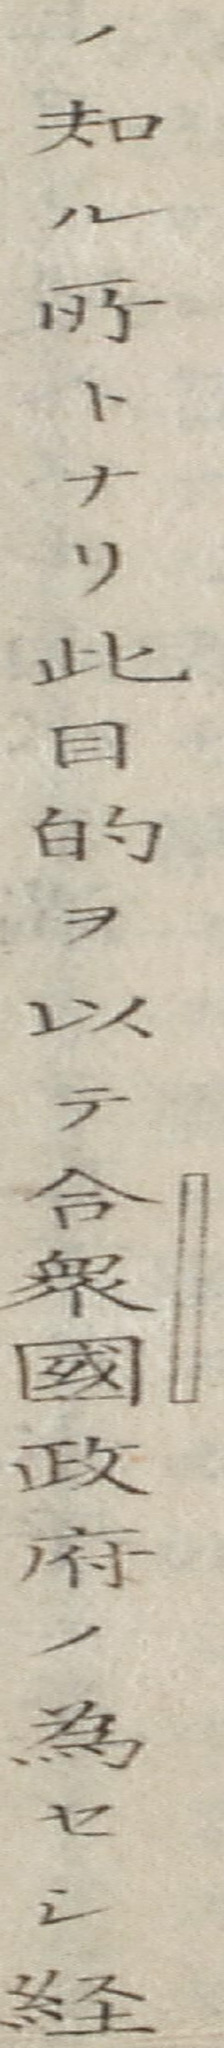ノ知ル所トナリ此目的ヲ以テ合衆国政府ノ為セシ経
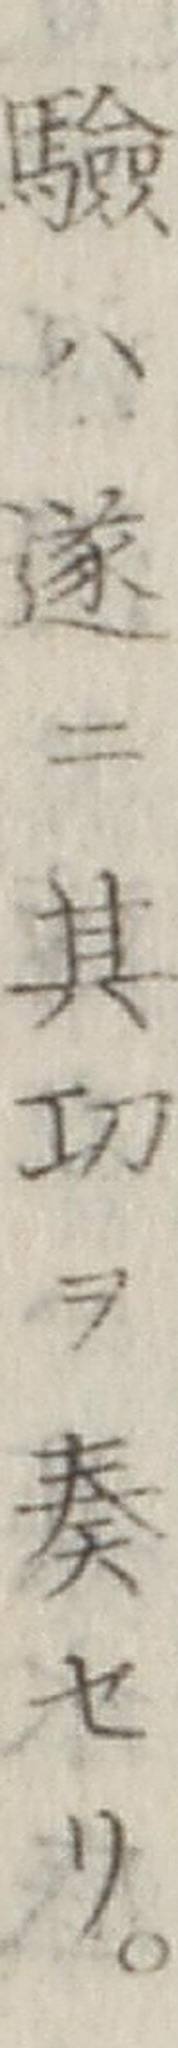験ハ遂ニ其功ヲ奏セリ。
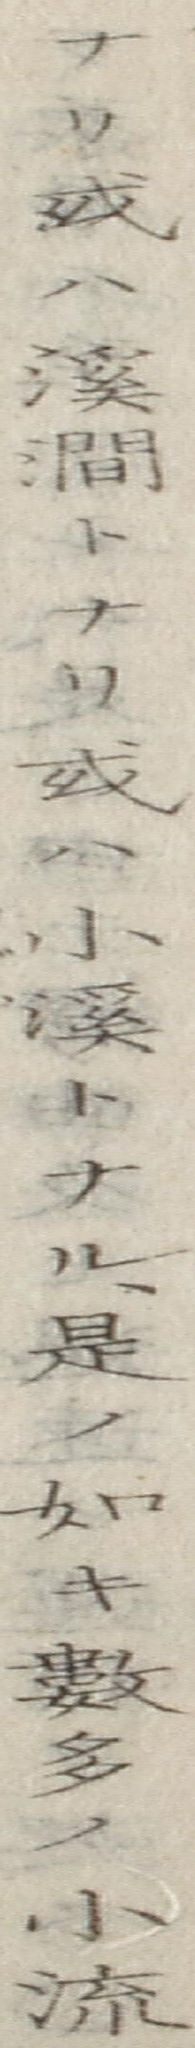ナリ或ハ渓澗トナリ或ハ小渓トナル、是ノ如キ数多ノ小流
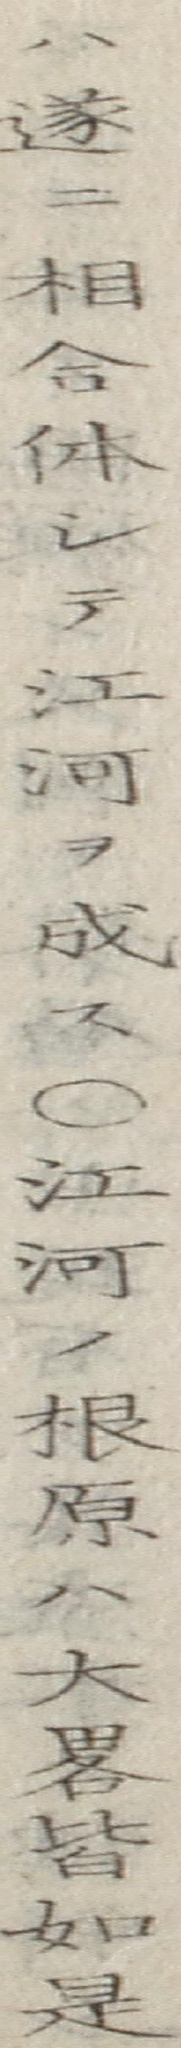ハ遂ニ相合体シテ江河ヲ成ス○江河ノ根原ハ大略皆如是
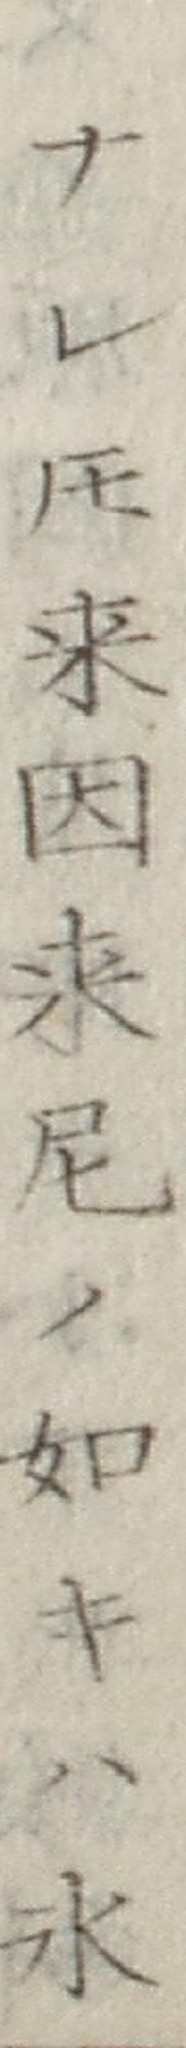ナレ𪜈来因来尼ノ如キハ氷
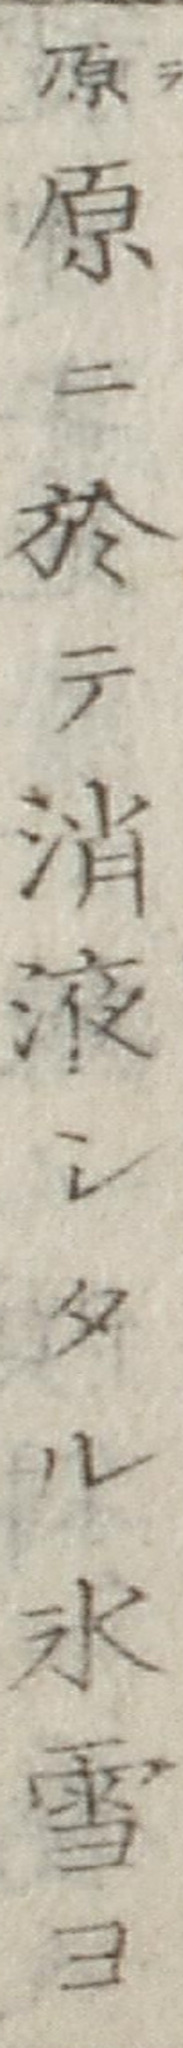原ニ於テ消液シタル氷雪ヨ
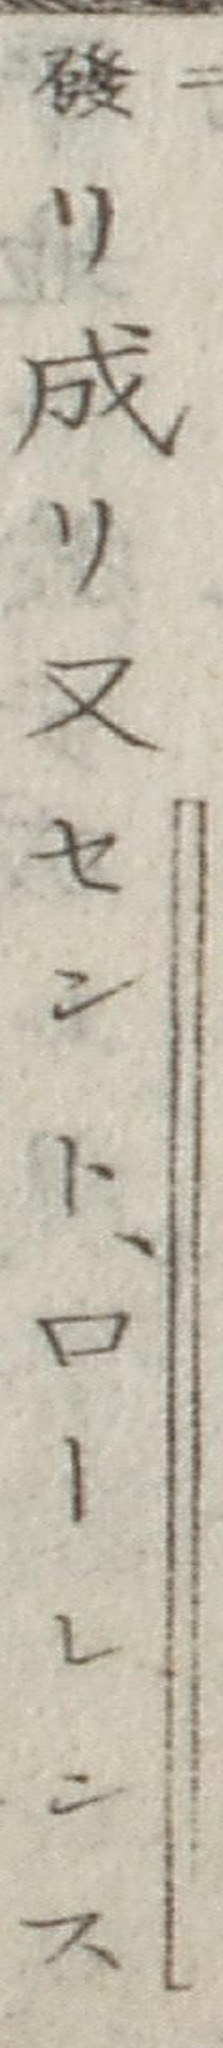リ成リ又セント、ローレンス
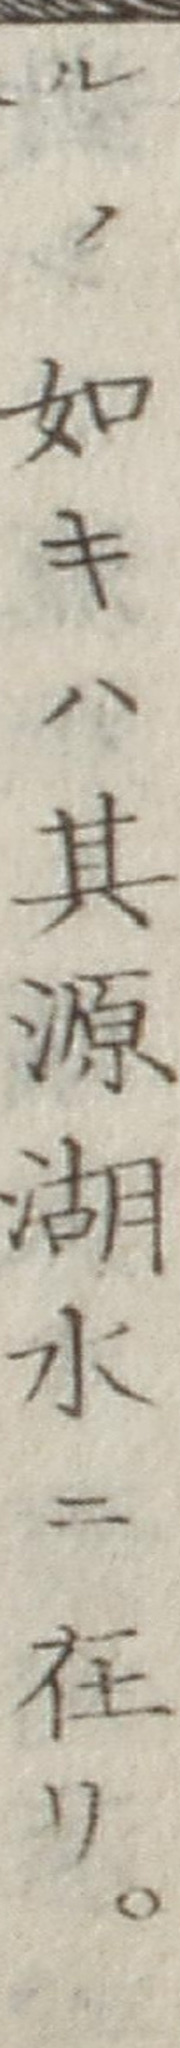ノ如キハ其源湖水ニ在リ。
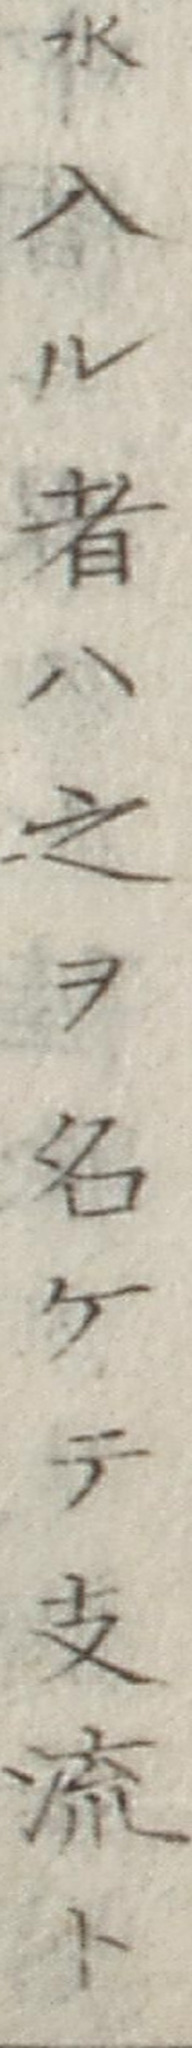入ル者ハ之ヲ名ケテ支流ト
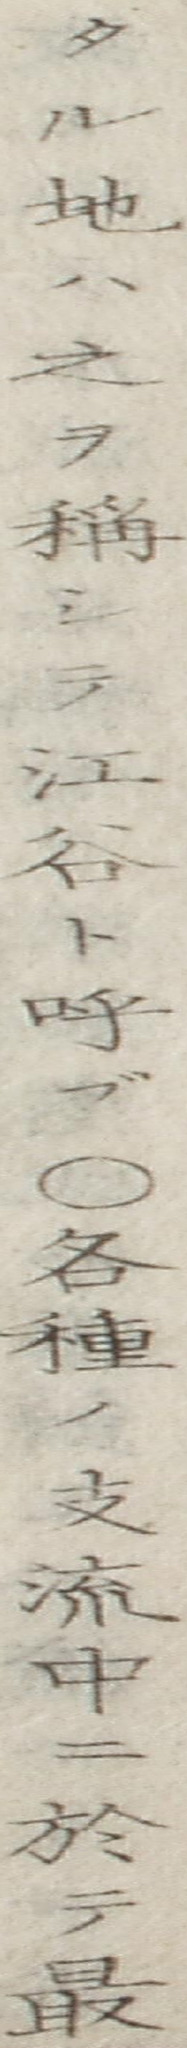タル地ハ之ヲ稱シテ江谷ト呼ブ○各種ノ支流中ニ於テ最
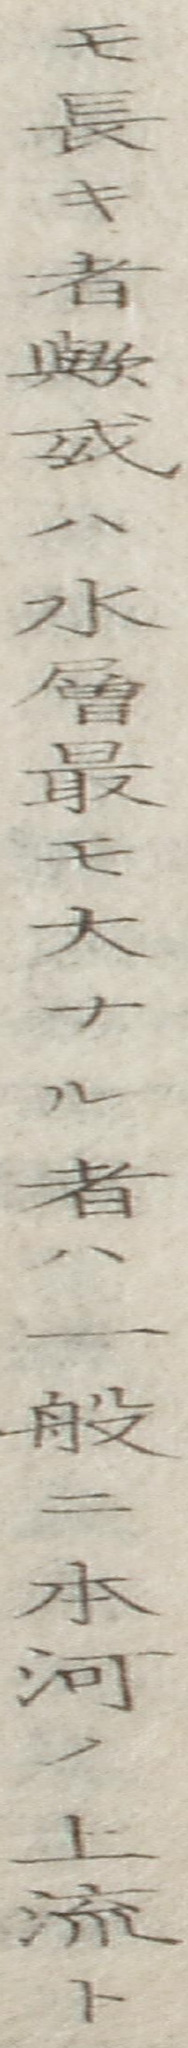モ長キ者歟或ハ水層最モ大ナル者ハ一般ニ本河ノ上流ト
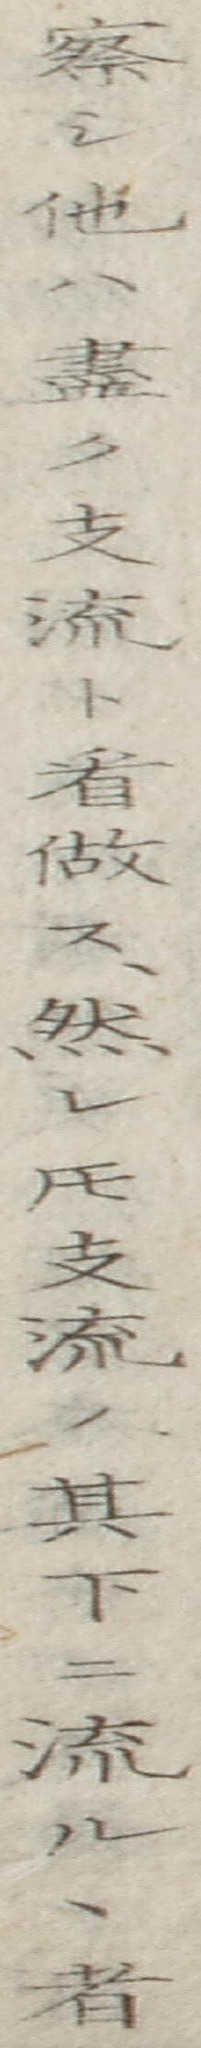察シ他ハ尽ク支流ト看做ス、然レ𪜈支流ノ其下ニ流ルヽ者
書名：地形論　巻二
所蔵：東京大学地震研究所図書室 Earthquake Research Institute Library, The University of Tokyo, JAPAN
